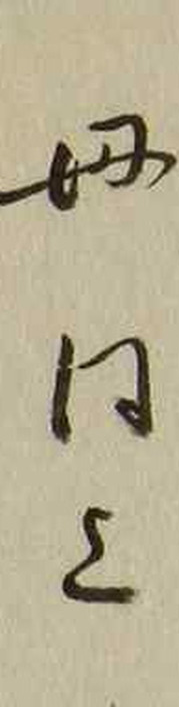母同上
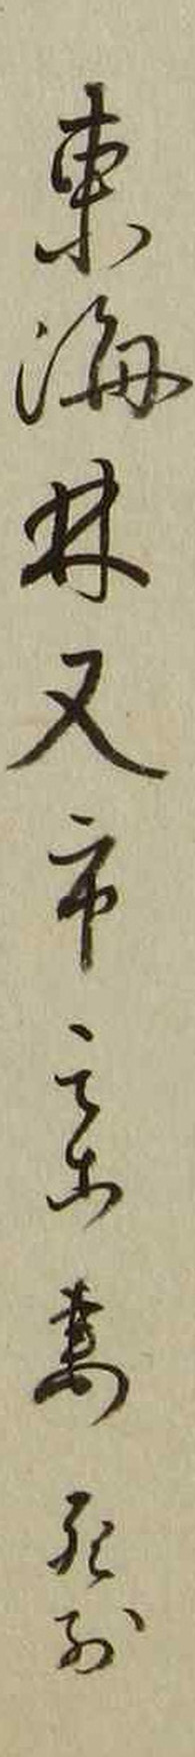女東海林又市某妻死別
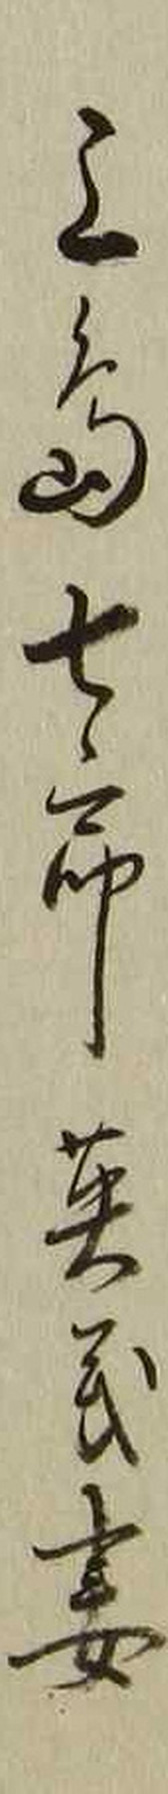上島七郎英義妻
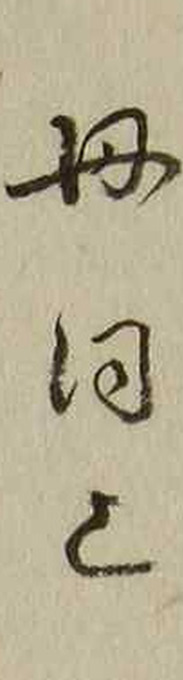母同上
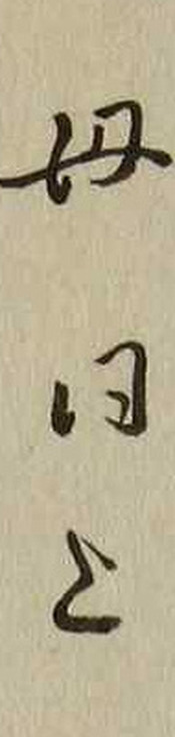母同上
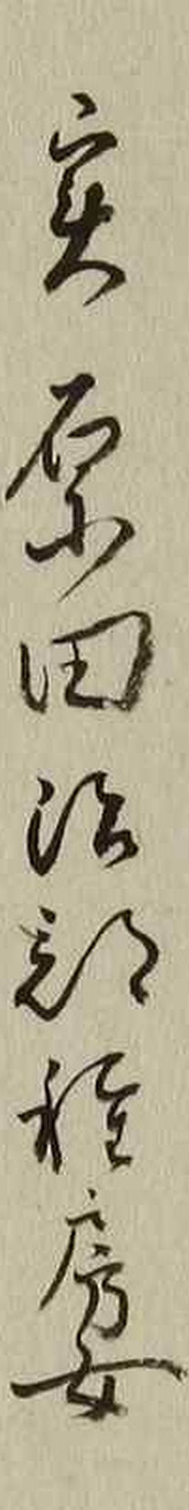実原田治部稚房女
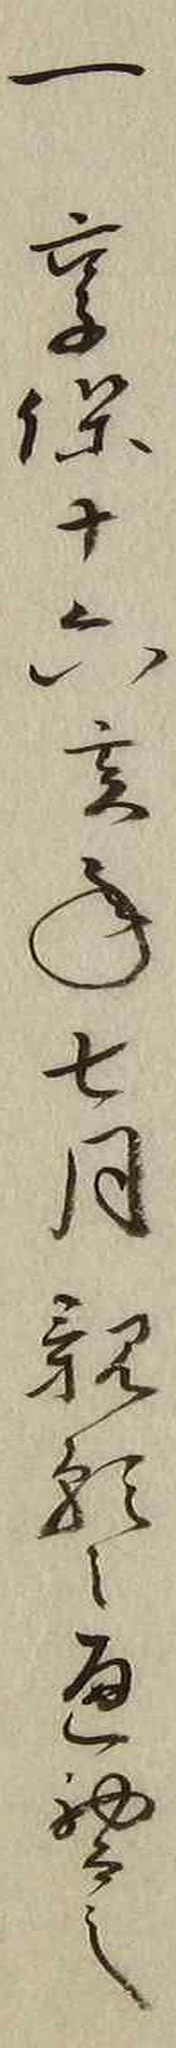一享保十六亥年七月親願之通初而之
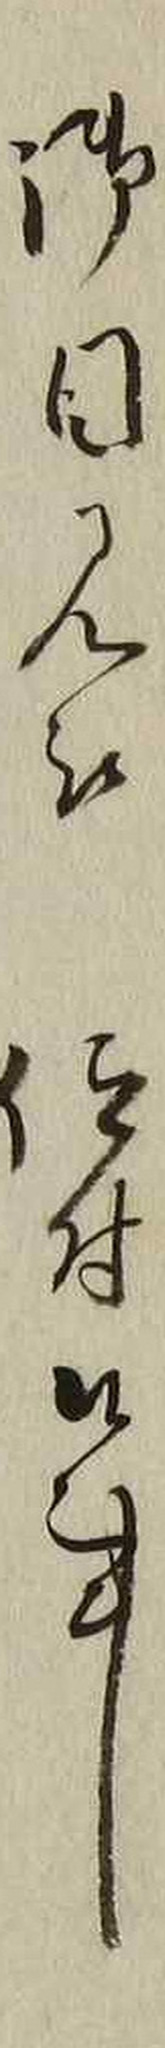御目見被仰付候事
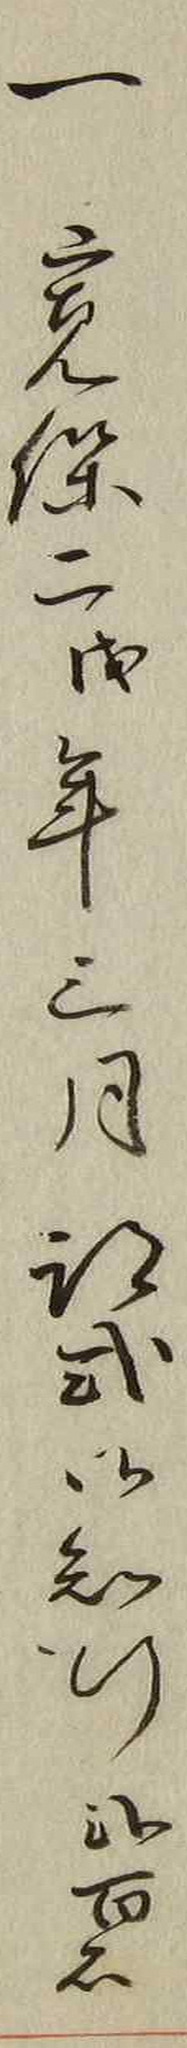一寛保二戌年三月跡式御知行弐百石
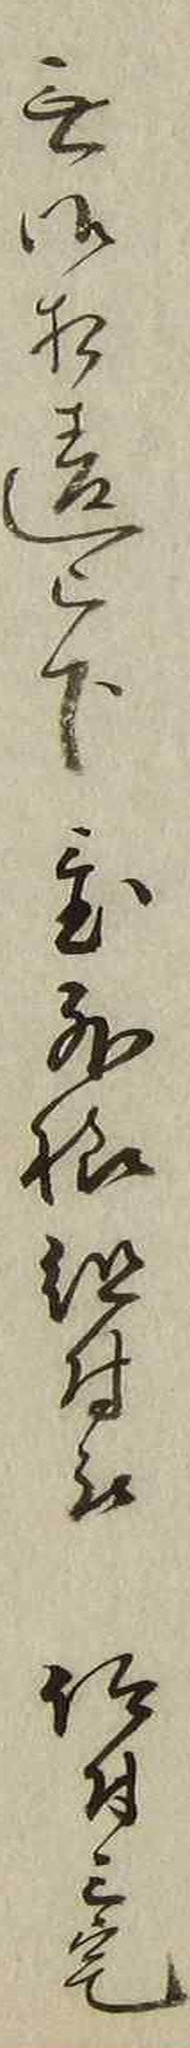無御相違被下置外様組付被仰付三宅
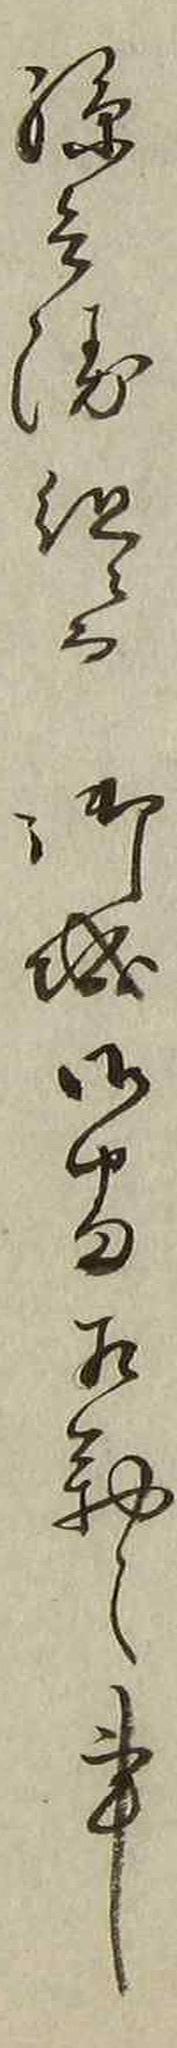源兵衛組に而御城御番相勤候事
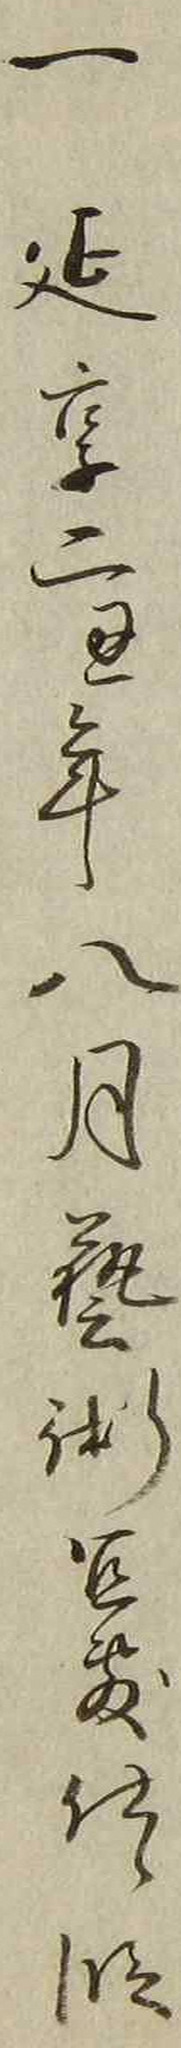一延享二丑年八月芸術宜敷仕候段
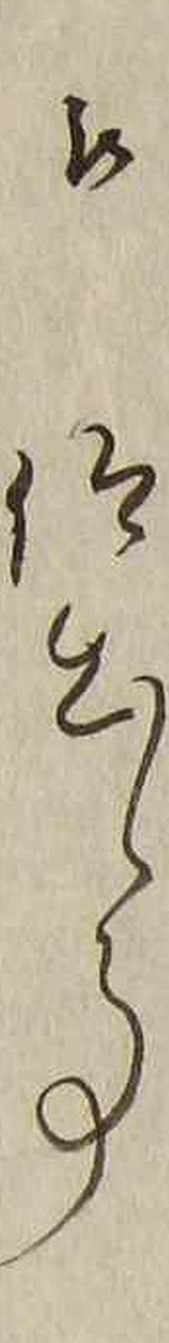被仰出候事

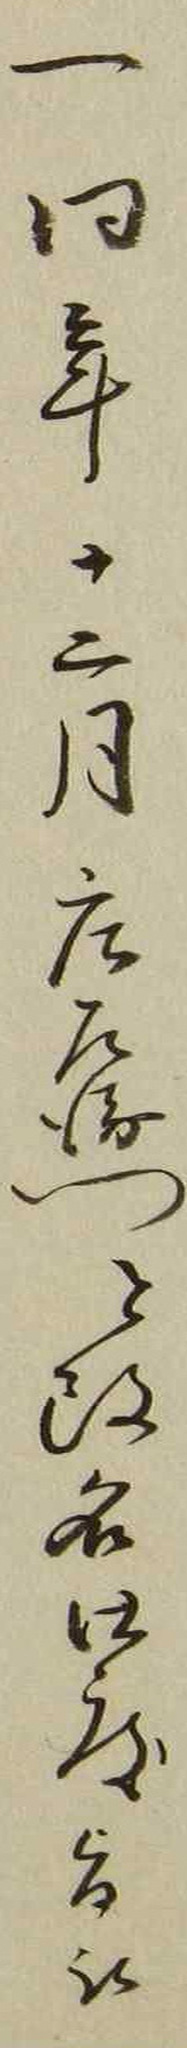一同年十二月庄左衛門と改名仕度旨被
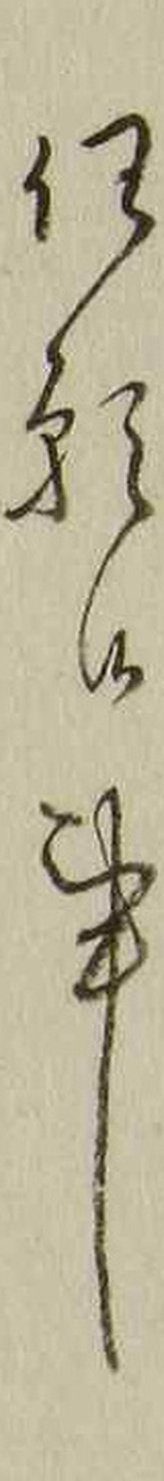任願候事
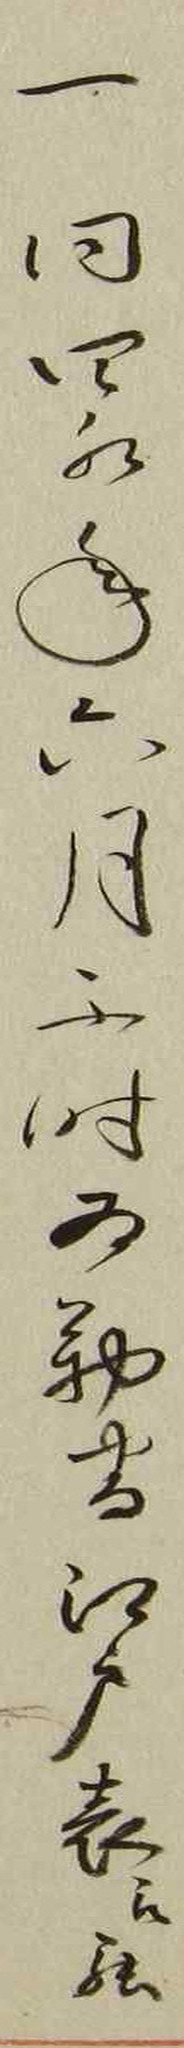一同四卯年六月不時為勤番江戸表江罷
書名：諸士系譜　巻之3　い之部3
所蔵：会津若松市立会津図書館
